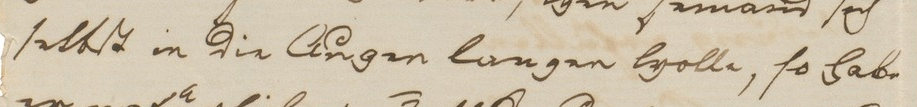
selbst in die Augen langen wolle, so habe
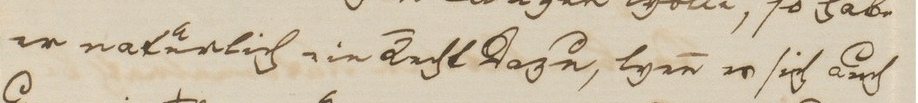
er natürlich ein Recht dazu, wenn es sich auch
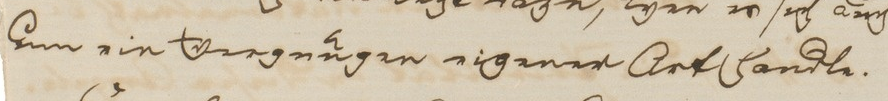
um ein Vergnügen eigener Art handle.
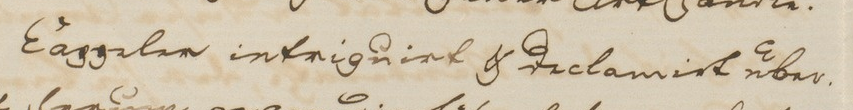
Cappeler intriguirt & declamirt über-
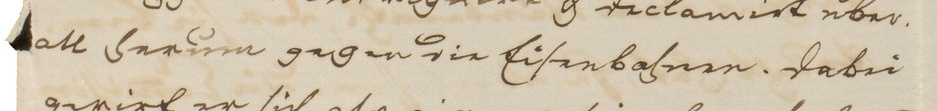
all herum gegen die Eisenbahnen. Dabei
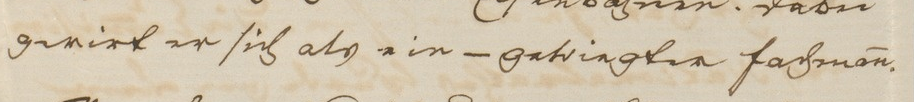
gerirt er sich als ein – gewiegter Fachmann.
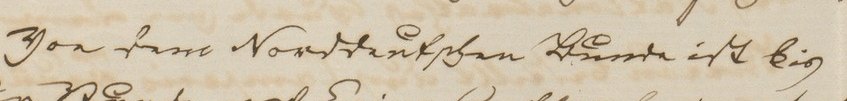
Von dem Norddeutschen Bunde ist bis
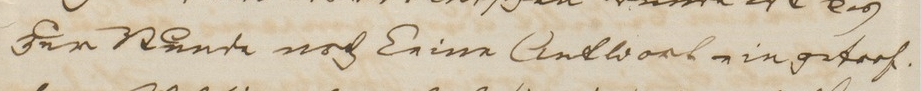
zur Stunde noch keine Antwort eingetrof-
